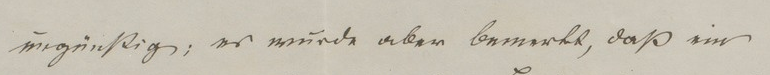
ungünstig; es wurde aber bemerkt, daß ein
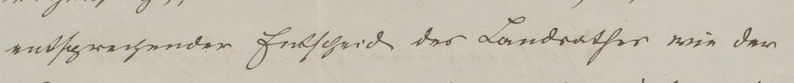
entsprechender Entscheid des Landrathes wie der
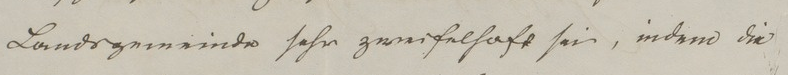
Landsgemeinde sehr zweifelhaft sei, indem die
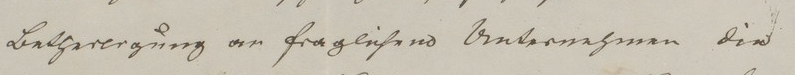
Betheiligung an fraglichem Unternehmen die
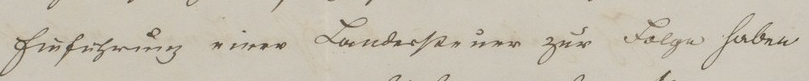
Einführung einer Landessteuer zur Folge haben
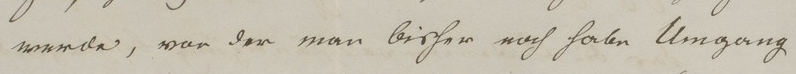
werde, vor der man bisher noch habe Umgang
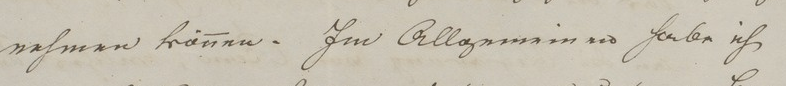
nehmen können. Im Allgemeinen habe ich
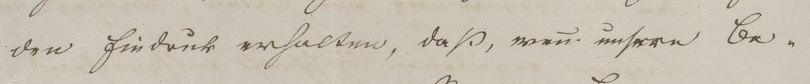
den Eindruk erhalten, daß, wenn unsere Be-
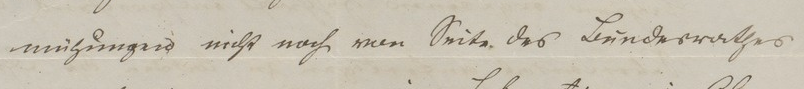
mühungen nicht noch von Seite des Bundesrathes
